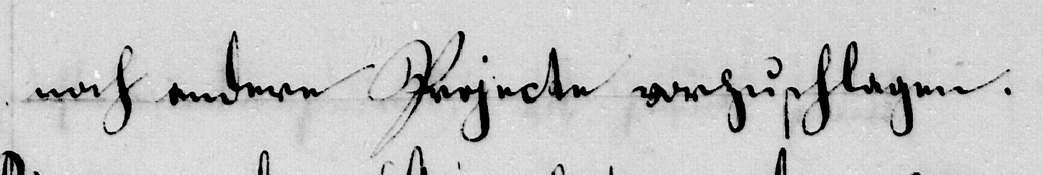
noch andere Projecte vorzuschlagen.
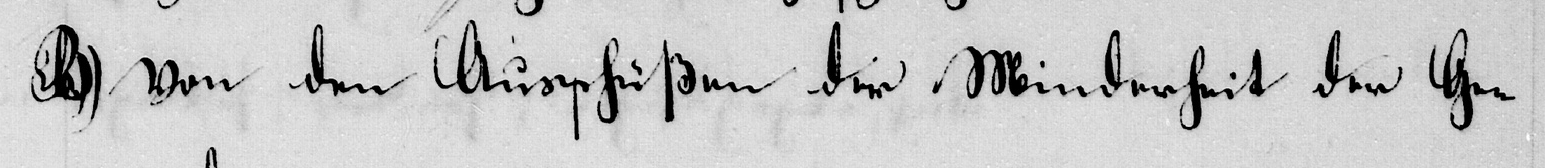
B.) Von den Ausschüßen der Minderheit der Ge¬
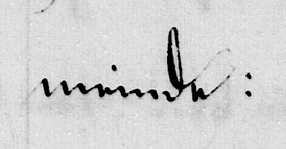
meinde:
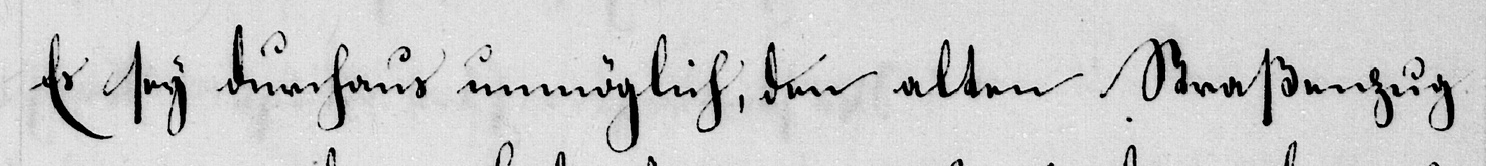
Es sey durchaus unmöglich, den alten Straßenzug
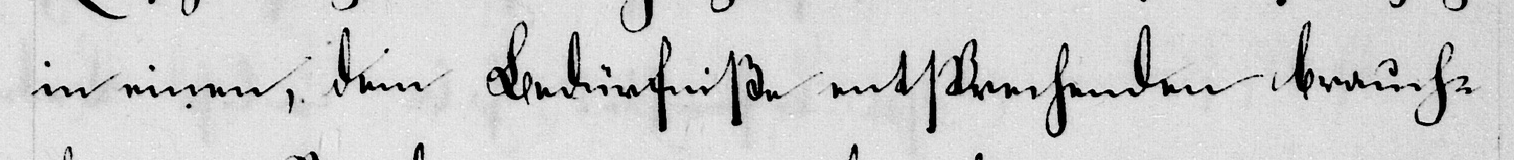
in einen, dem Bedürfniße entsprechenden brauch¬
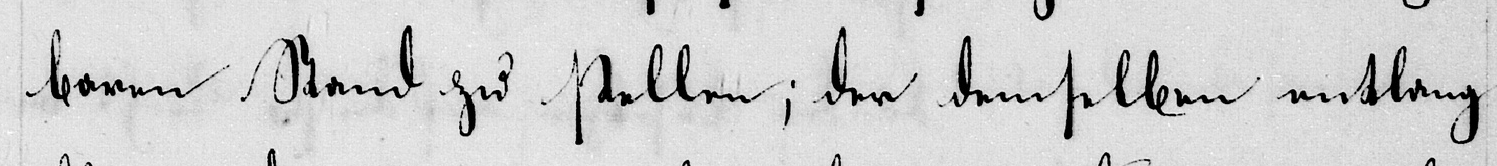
baren Stand zu stellen; der demselben entlang
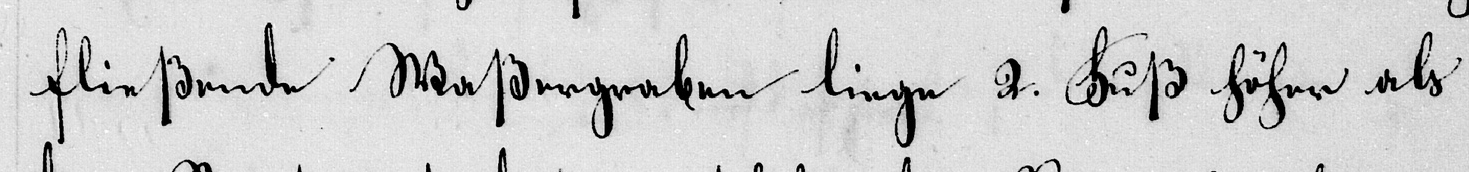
fließende Waßergraben liege 2. Fuß höher als
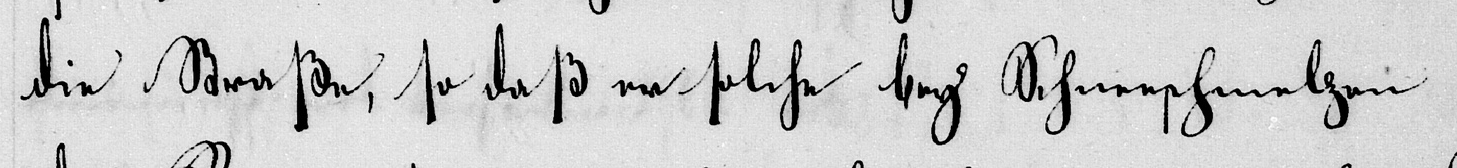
die Straße, so daß er solche bey Schneeschmelzen
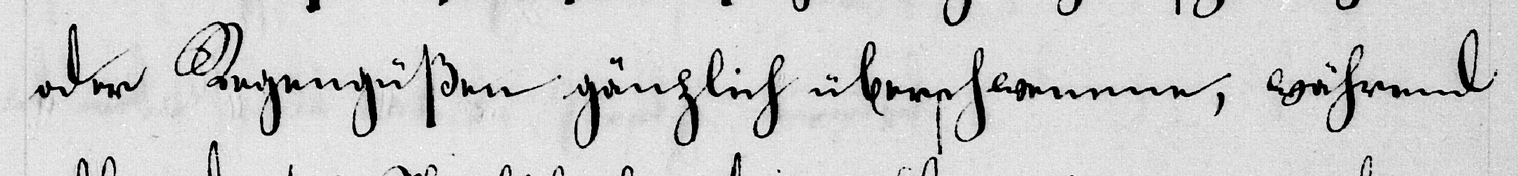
oder Regengüßen gänzlich überschwemme, während
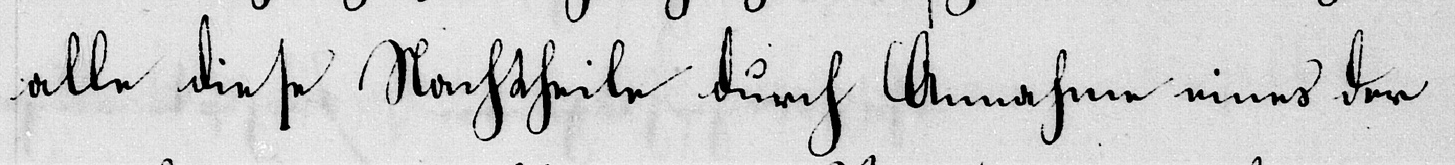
alle diese Nachtheile durch Annahme eines der
